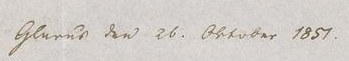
Glarus den 26. Oktober 1851.
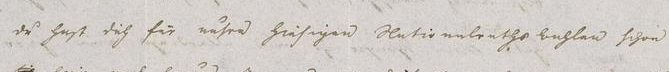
Du hast Dich für unsre hiesige Nationalrathswahlen schon
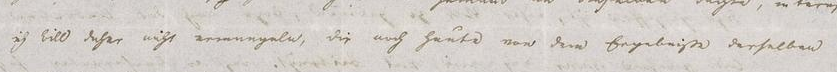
ich will daher nicht ermangeln, Dir noch heute von dem Ergebnisse derselben
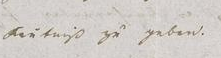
Kenntniß zu geben.
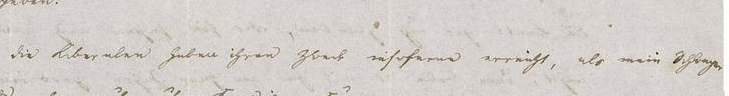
Die Liberalen haben ihren Zweck insofern erreicht, als mein Schwager
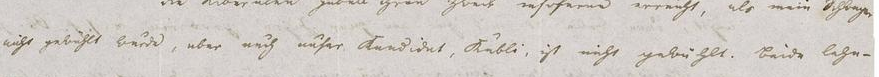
nicht gewählt wurde, aber auch unser Kandidat, Kubli, ist nicht gewählt. Beide lehn-
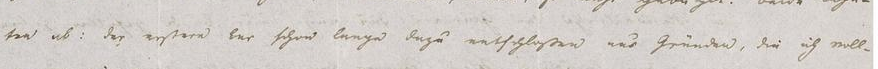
ten ab: der erstere war schon lange dazu entschlossen aus Gründen, die ich voll-
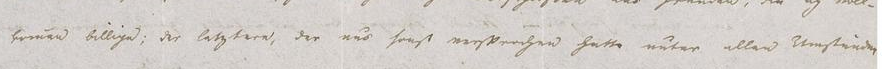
kommen billige; der letztere, der uns sonst versprochen hatte unter allen Umständen
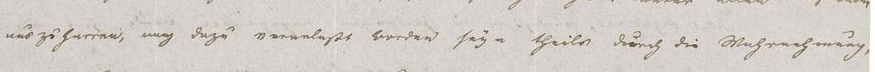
auszuharren, mag dazu veranlaßt worden seyn theils durch die Nachrechnung,
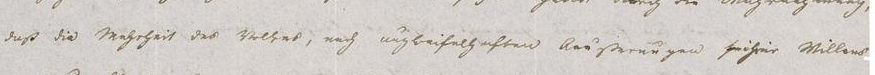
daß die Mehrheit des Volkes, nach unzweifelhaften Aeußerungen seiner Willens-
